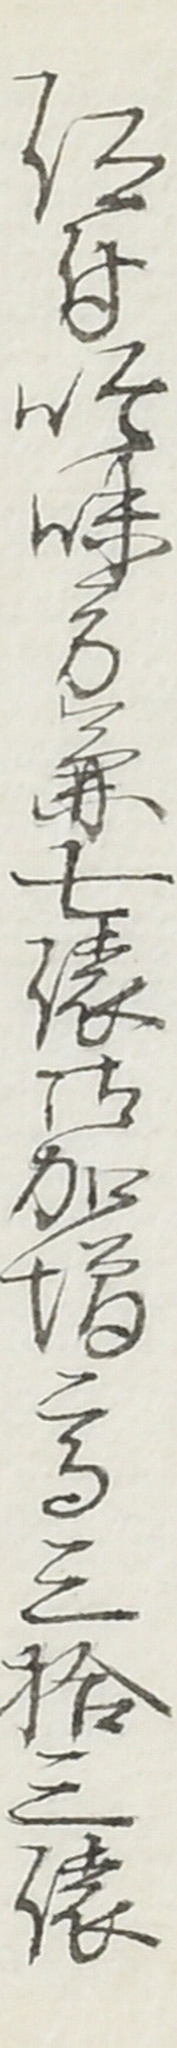仰付吟味方兼七俵御加増高三拾三俵
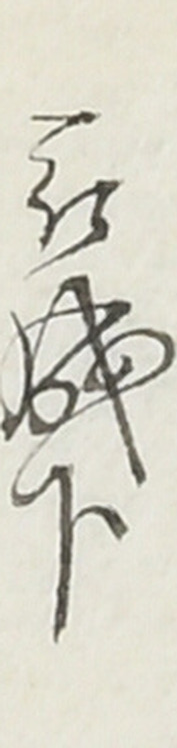被成下
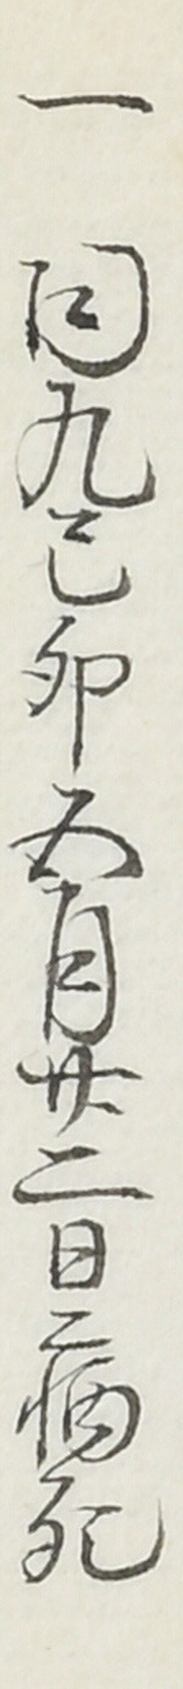一同九己卯五月廿二日病死

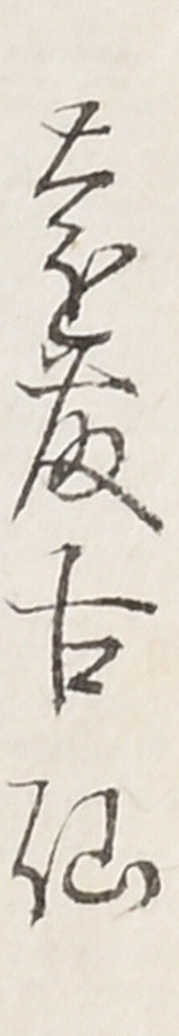遠藤古仙
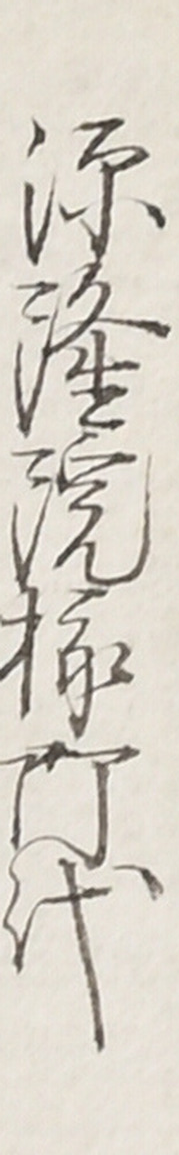源隆院様御代
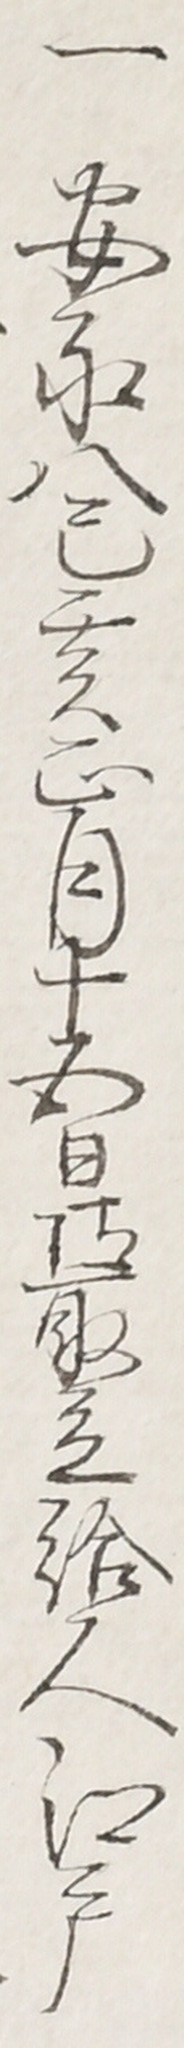一安永八己亥正月十五日御取立給人江戸
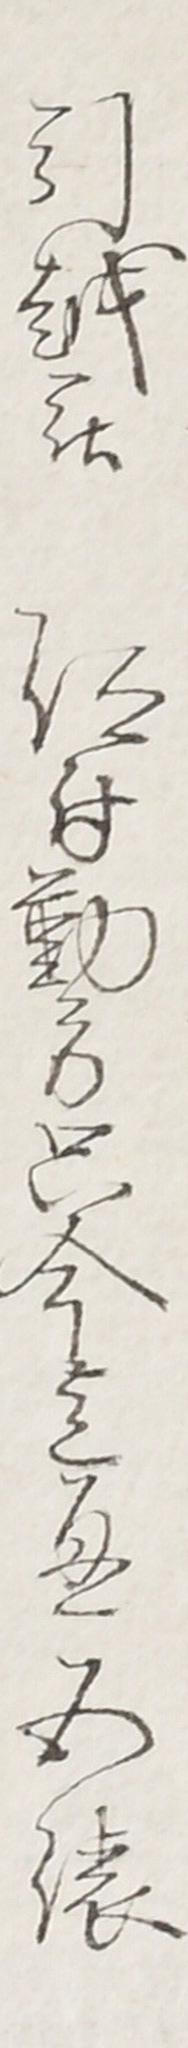引越被仰付勤方只今迄通五俵
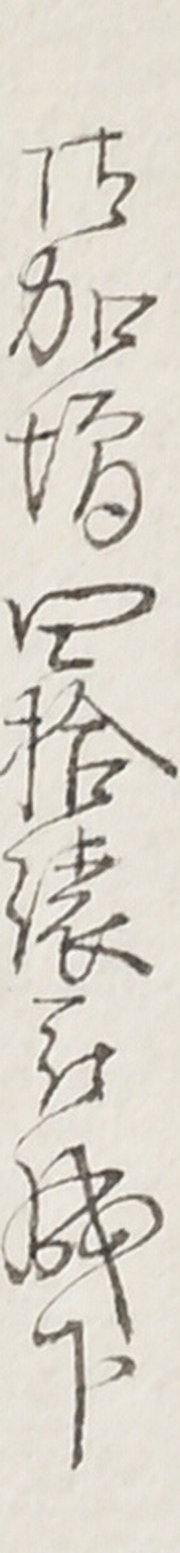御加増四拾俵被成下
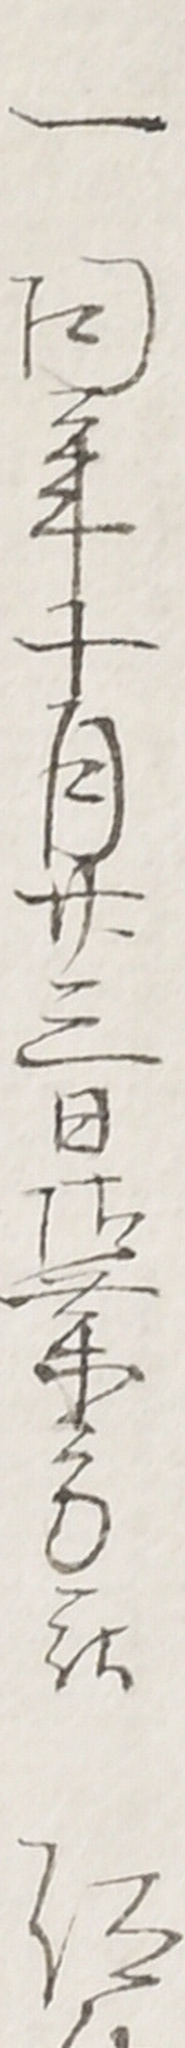一同年十月廿三日御薬方被仰付
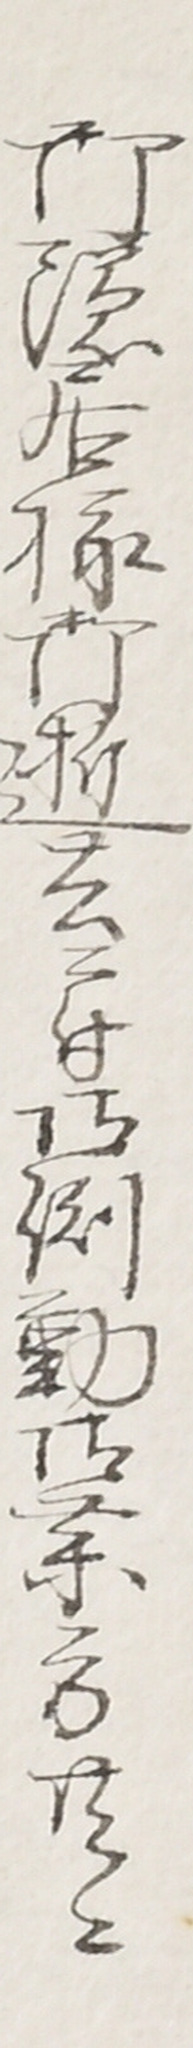御隠居様御逝去ニ付御側勤御薬方共ニ
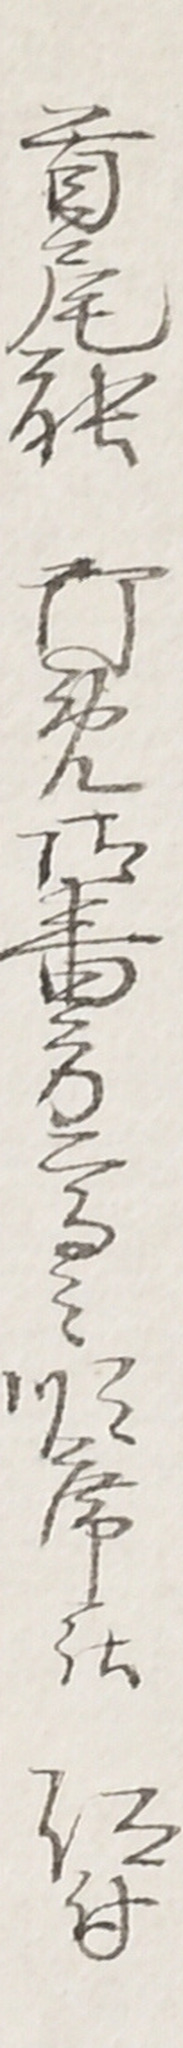首尾能御免御番方高之順席被仰付
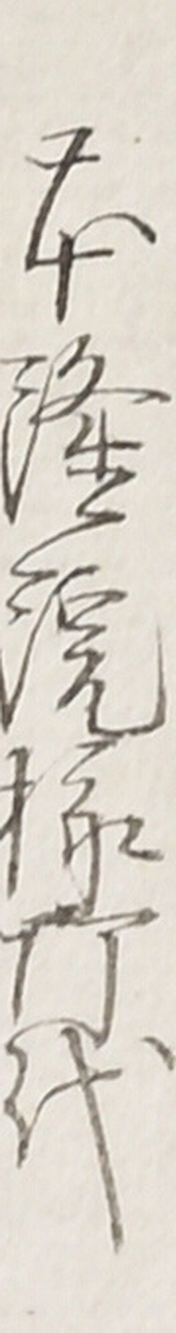本隆院様御代
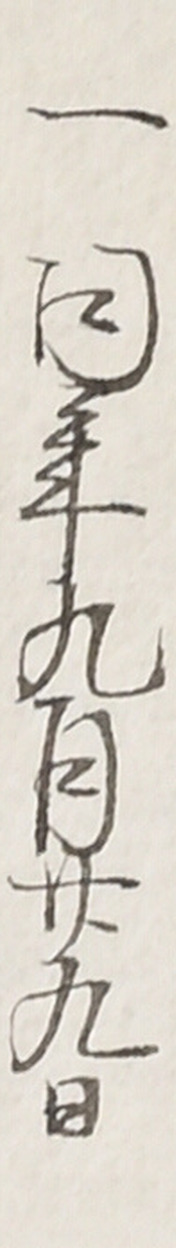一同年九月廿九日
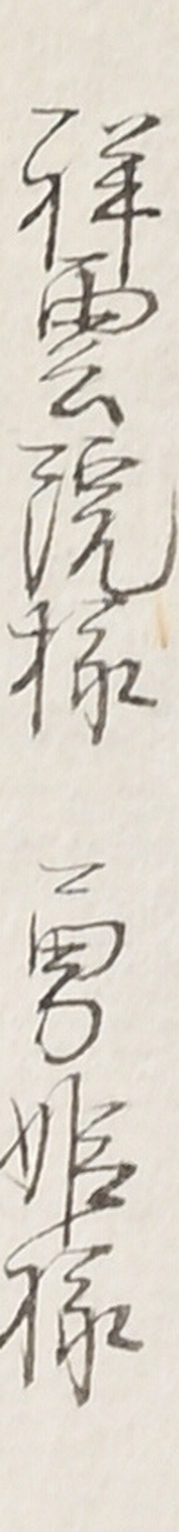祥雲院様勇姫様
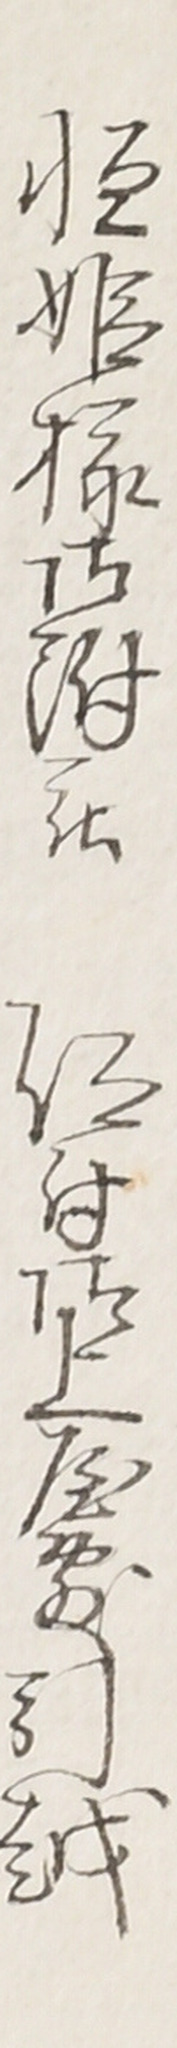恒姫様御附被仰付御上屋敷引越
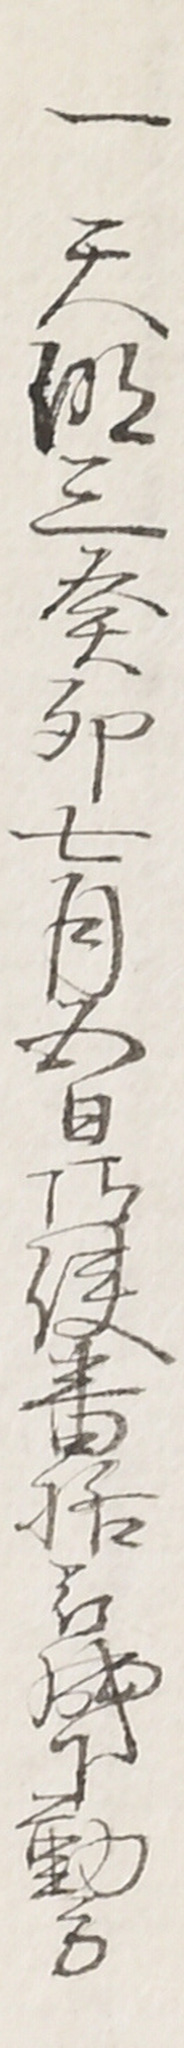一天明三癸卯七月五日御使番格被成下勤方
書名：給人諸士勤仕録（七）
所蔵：伊那市立高遠町図書館・合同会社AMANE
